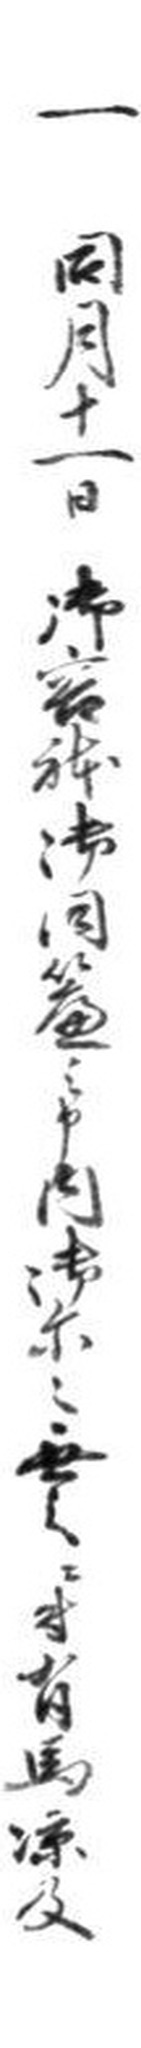一同月十一日御容体御同篇与申内御爾々無之二付有馬涼及
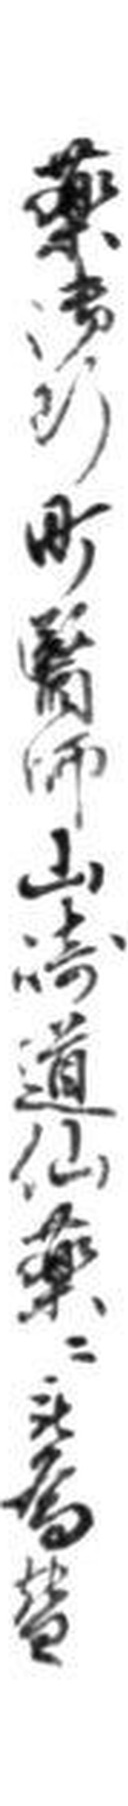薬御改町医師山崎道仙薬ニ被為替
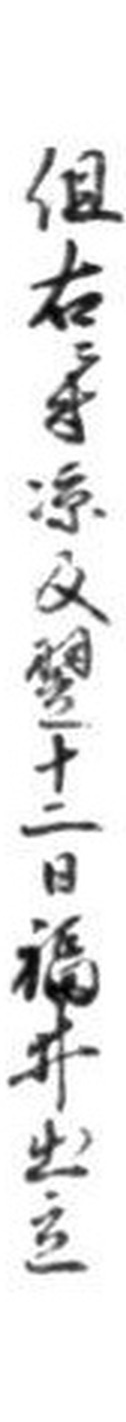但右ニ付涼及翌十二日福井出立
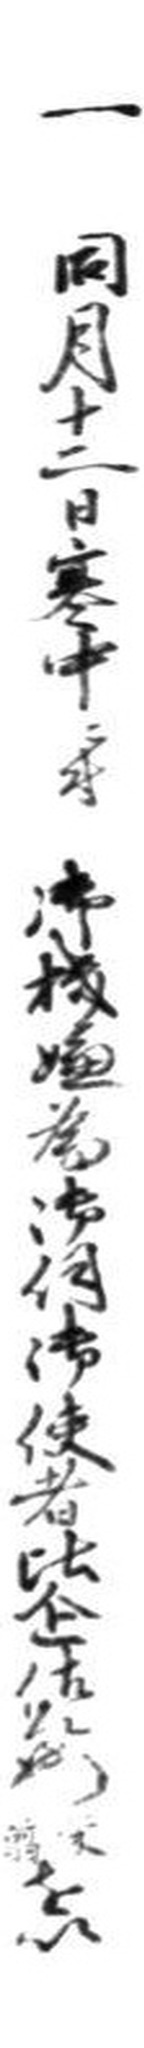一同月十二日寒中ニ付御機嫌為御伺御使者比企佐左衛門栄翦を以
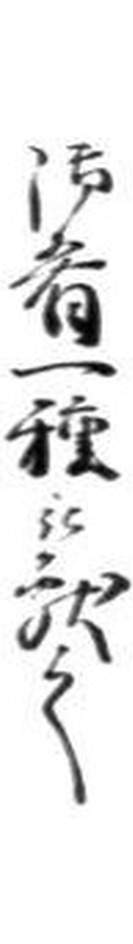御肴一種被献之
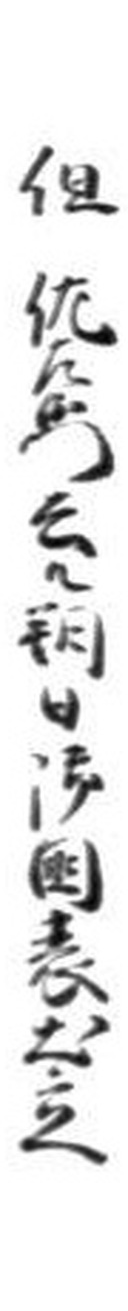但佐左衛門去朔日御国表出立
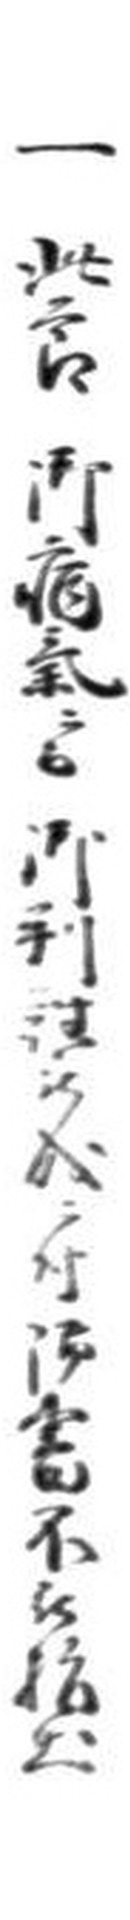一此節御病気ニ而御判難被成ニ付御書不被指出
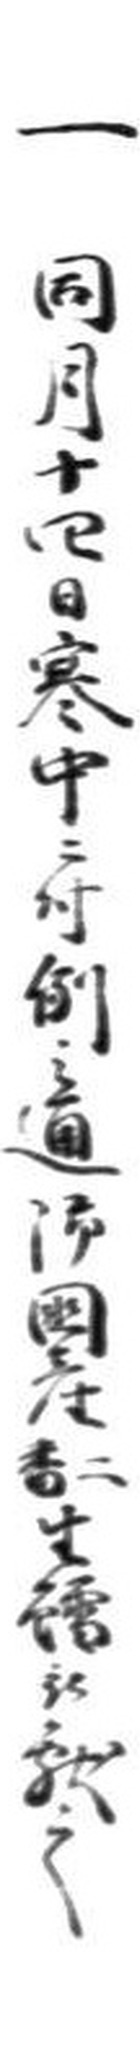一同月十四日寒中ニ付例之通御国産ニ番生鱈被献之
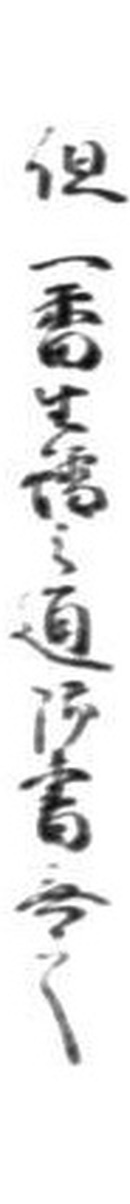但一番生鱈之通御書無之
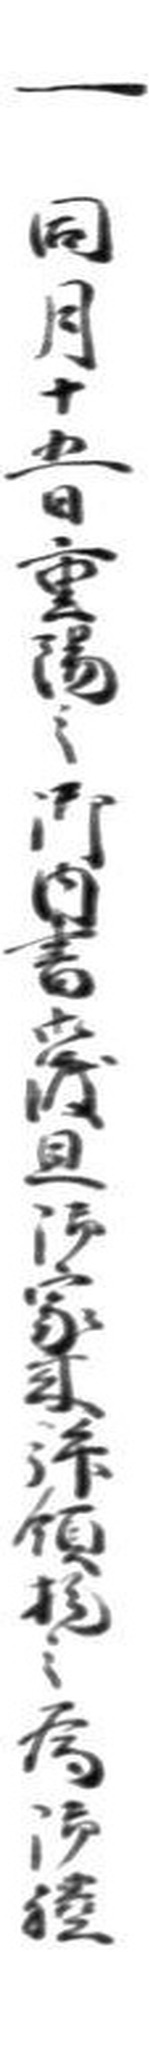一同月十五日重陽之御内書御渡且御家来拝領物之為御礼
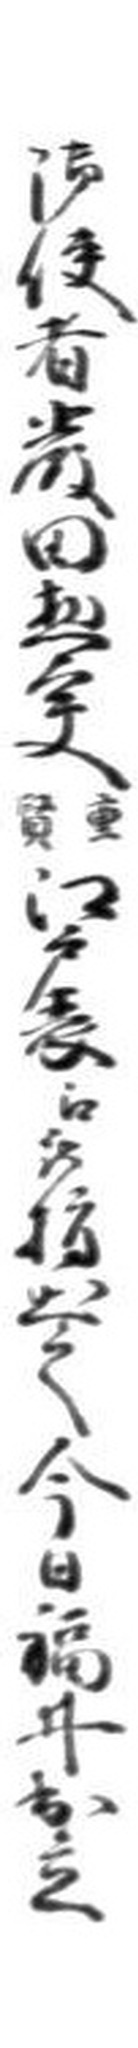御使者藤田惣大夫重賢江戸表江被指出之今日福井出立
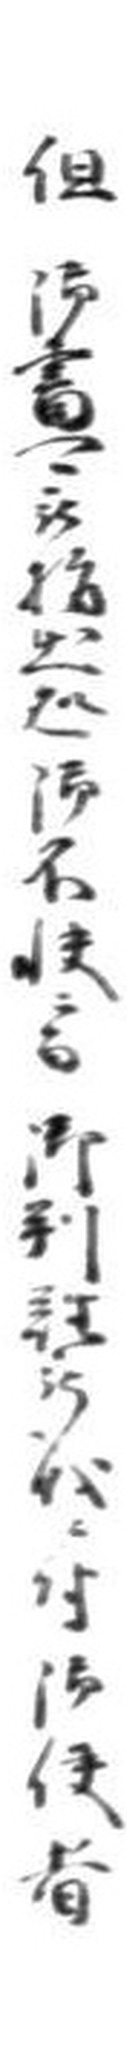但御書可被指出処御不快ニ而御判難被成ニ付御使者
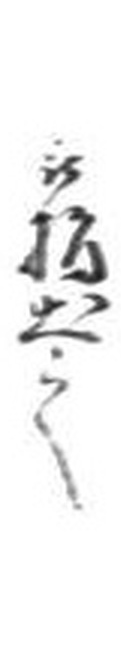被指出之

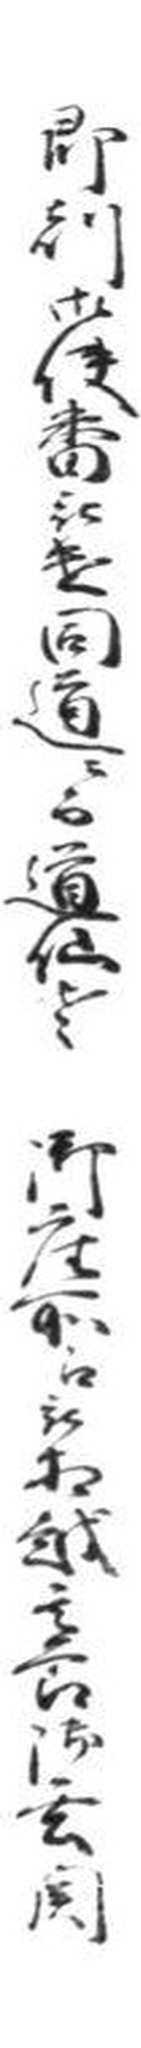即刻御使番被遣同道ニ而道仙老御座所江被相越其節御玄関
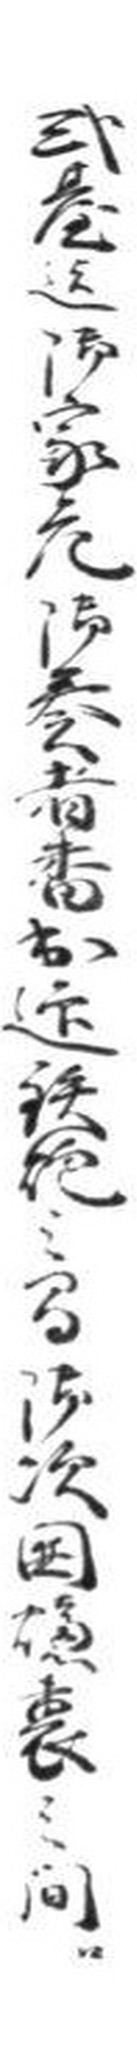式台迄御家老御奏者番出迎鉄砲之間御次囲炉裏之間江
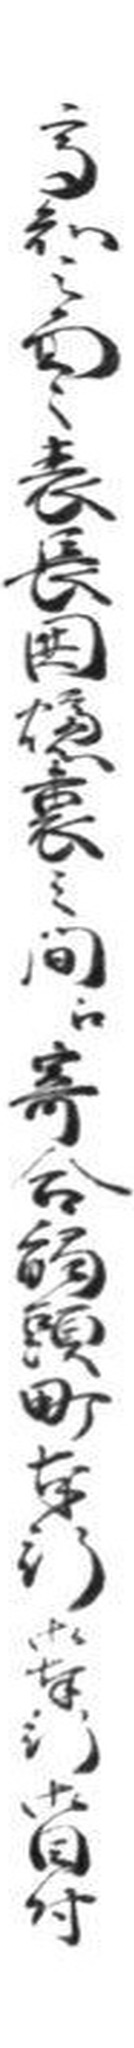高知之面々表長囲炉裏之間江寄合触頭町奉行御奉行御目付
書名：家譜 十七 吉品公 従元禄元年到同二年
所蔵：福井県文書館 Fukui Prefectural Archives
